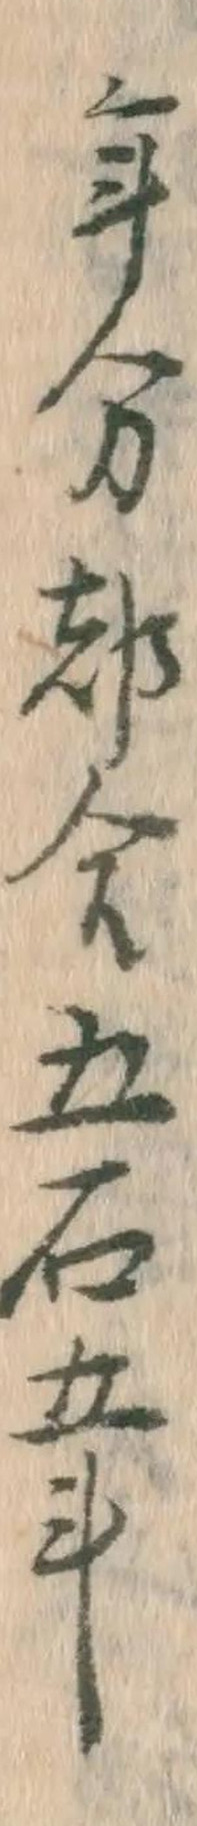年分都合五石五斗
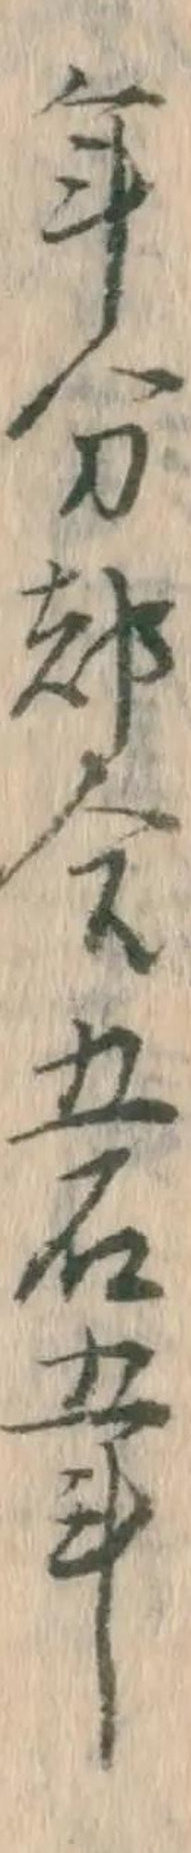年分都合五石五斗
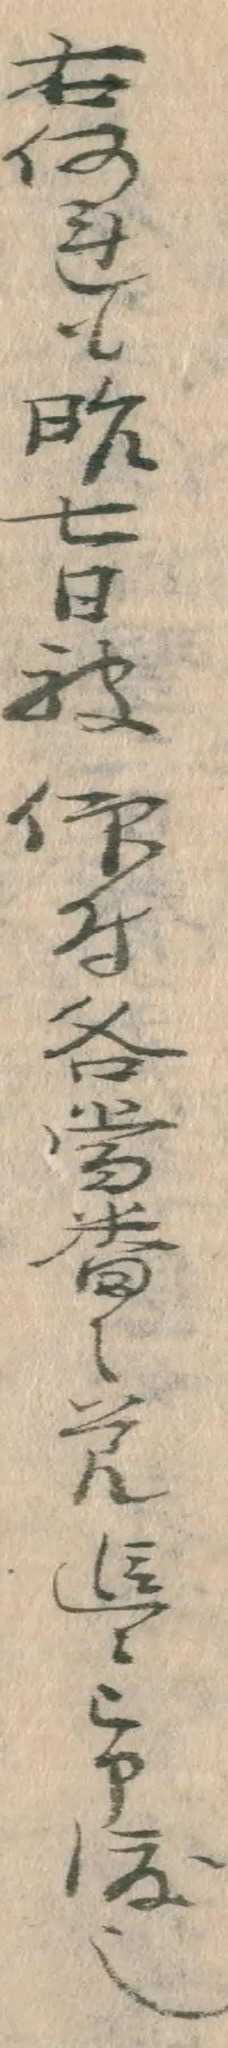右何れも昨七日被仰付各當番之節追々被申渡也
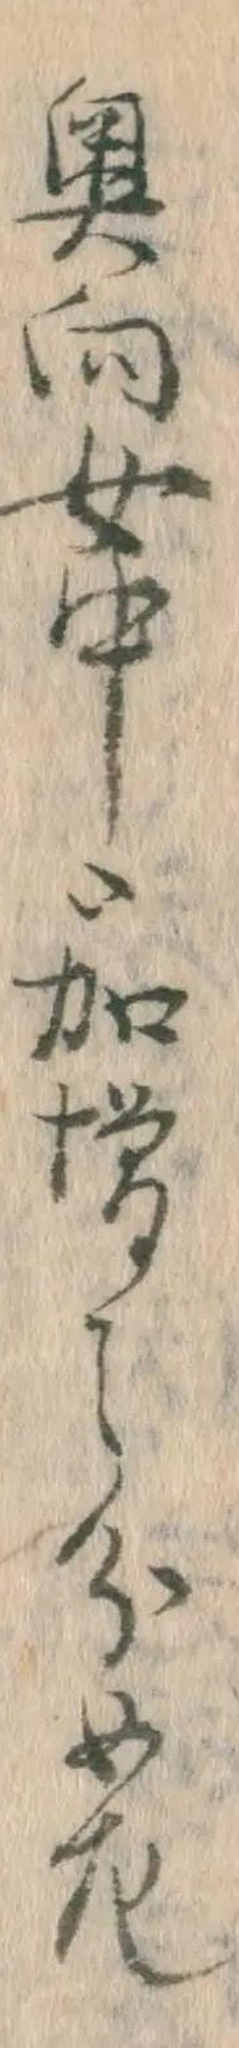奥向女中御加増之分如左
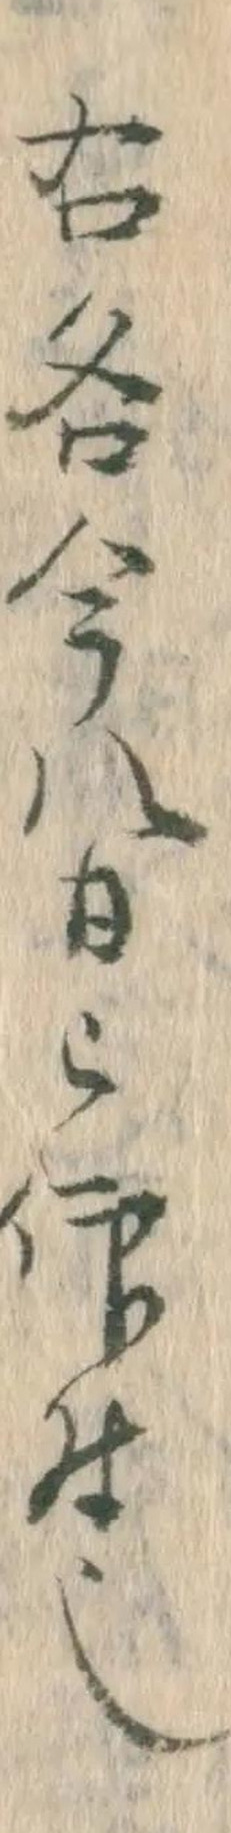右各今八日被仰付也
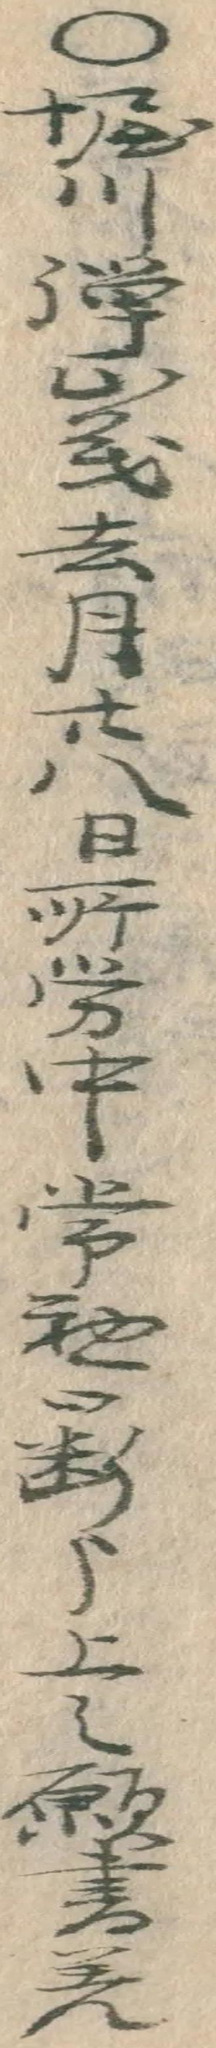○堀川弾正義去月廿八日所労中常惣御断申上候願書差
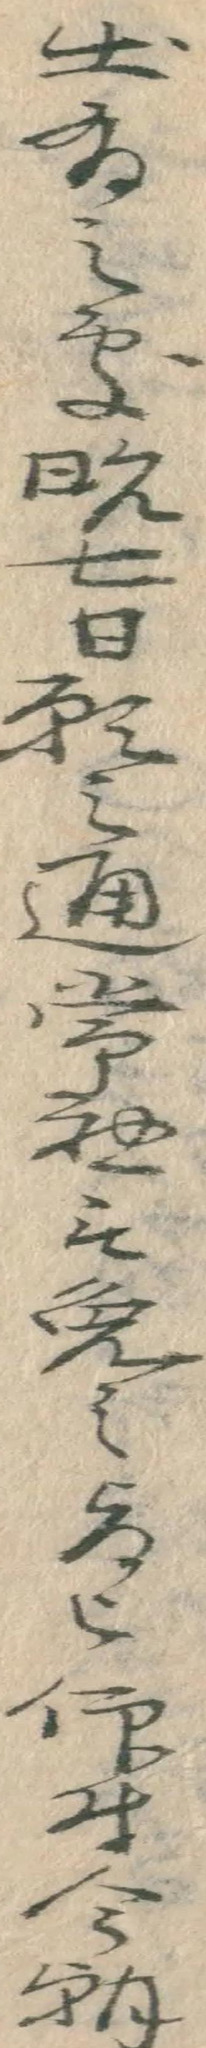出有之處昨七日願之通常惣無免之旨被仰付今朝
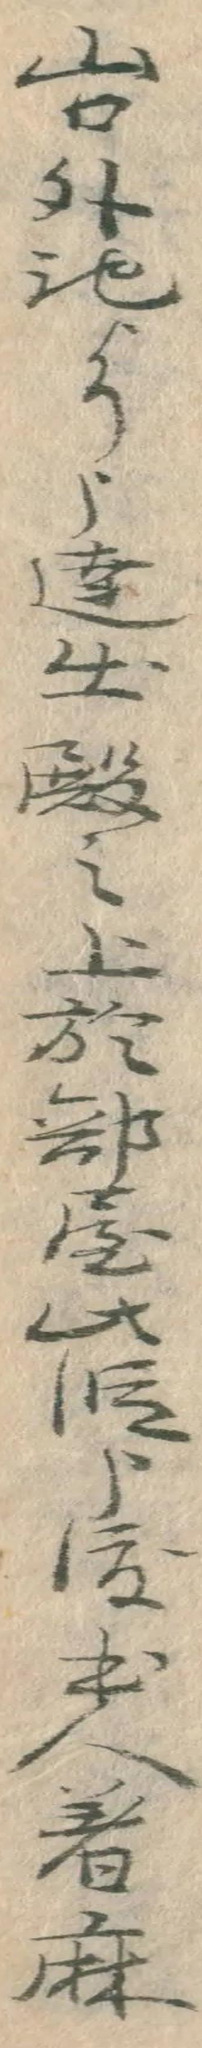山口外記より申達出殿之上於部屋此段申渡本人着麻

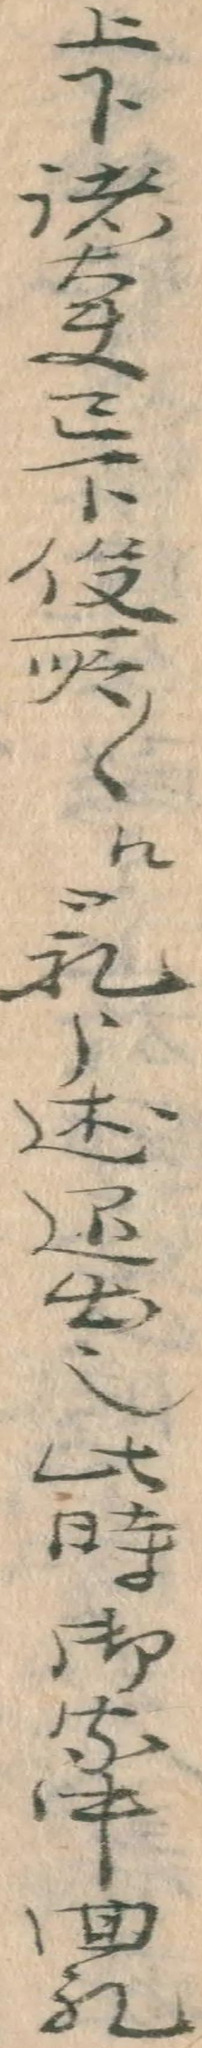上下諸大夫已下役所〳〵え御礼申述退出也此時御家中回礼
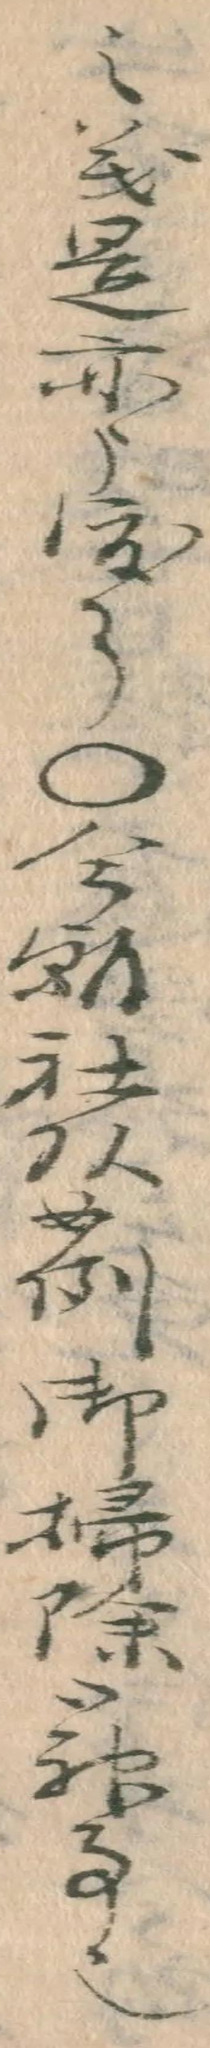之義是亦申渡了○今朝社頭如例御掃除御神事也
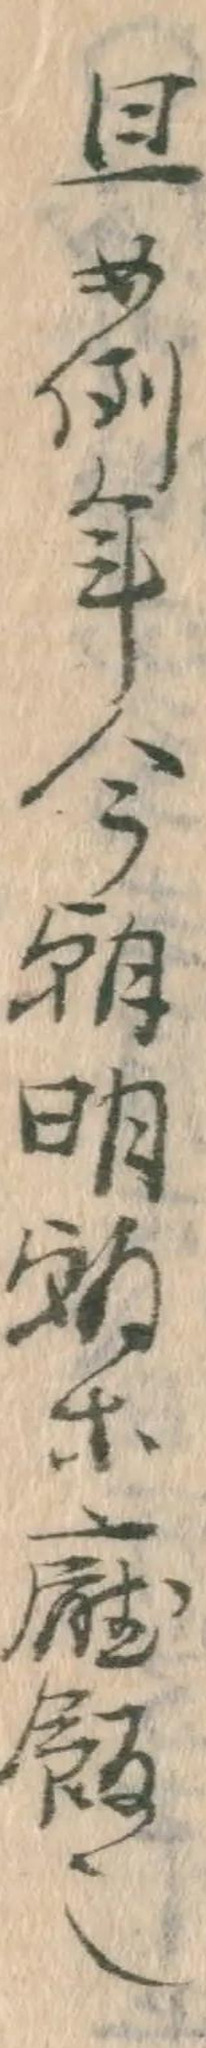且如例年今朝明朝等廳飯也
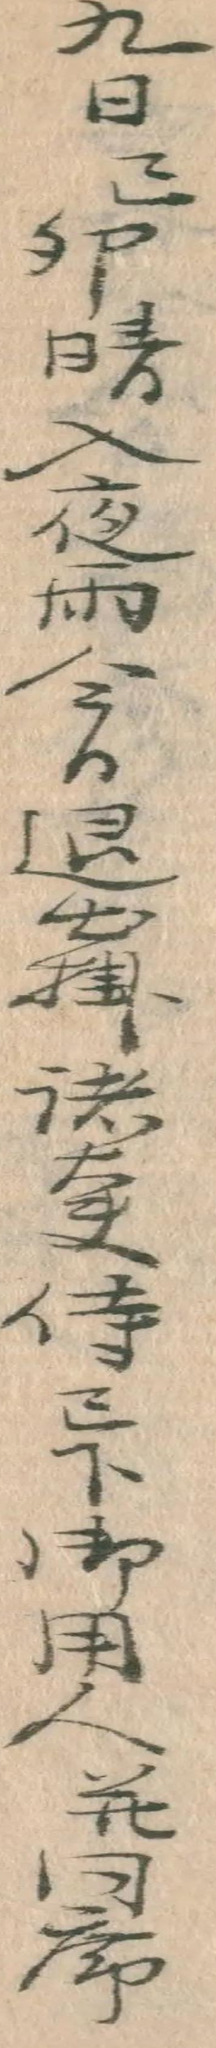九日己卯晴入夜雨今日退出掛諸大夫侍已下御用人幷同席
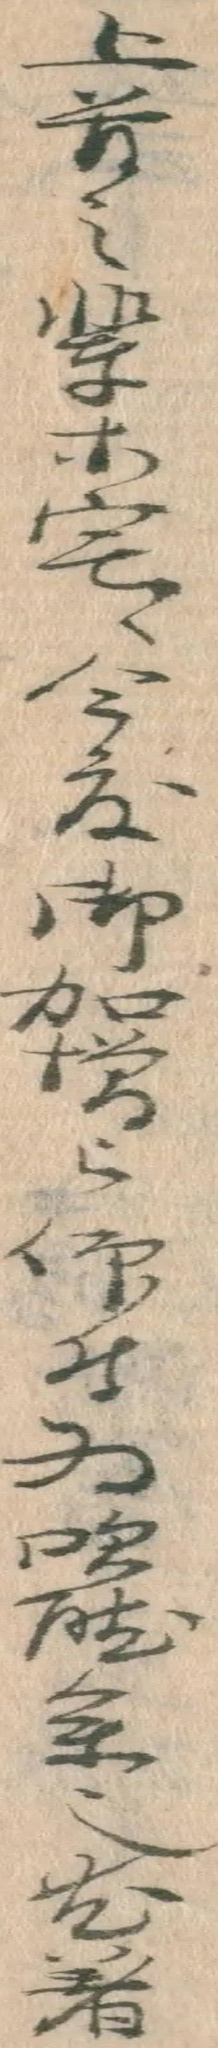上首之輩等宅へ今度御加増被仰付為吹聴参也尤着
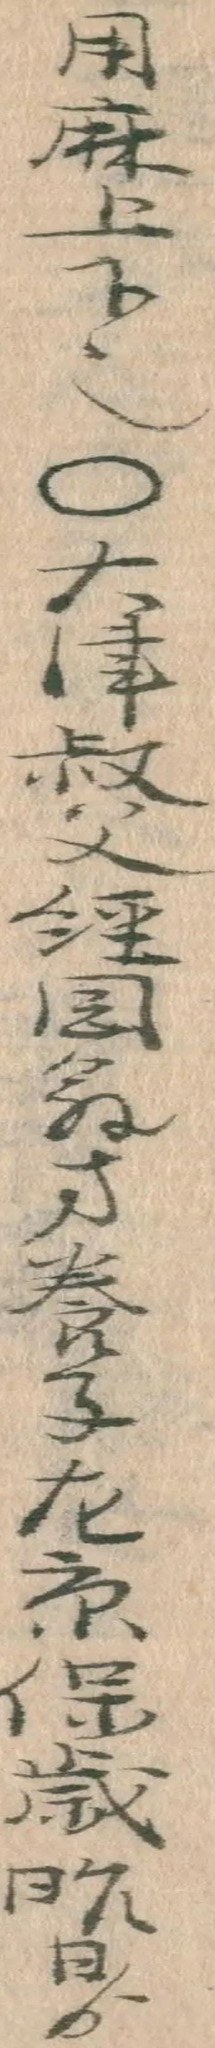用麻上下也○大津叔父経岡翁方養子左京保歳昨日ゟ
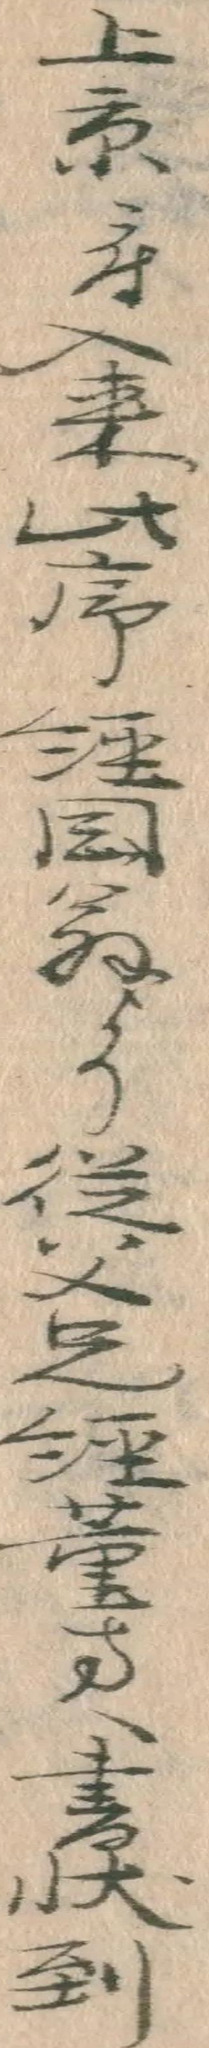上京ニ付入来此序経岡翁より従父兄経董方へ書状到
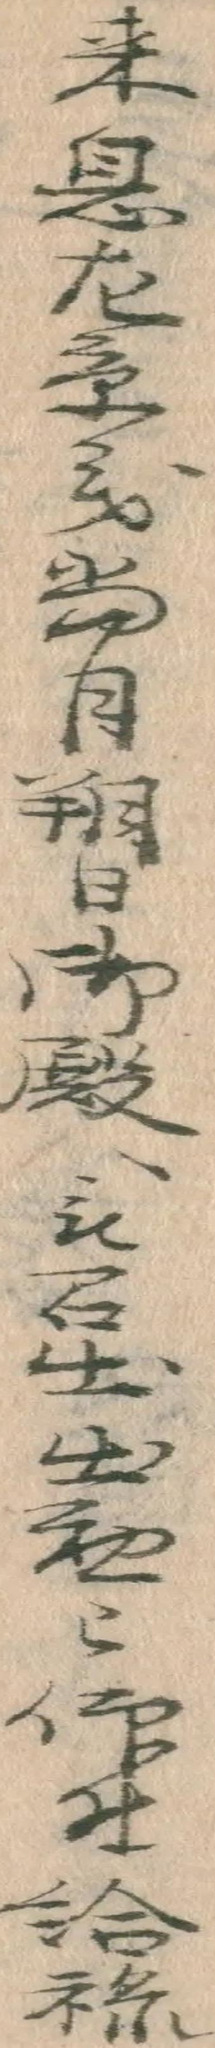来息左京義當月朔日御殿へ被召出出勤被仰付給禄
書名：賀茂社記録. 第63冊
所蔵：国立国会図書館 National Diet Library, JAPAN
